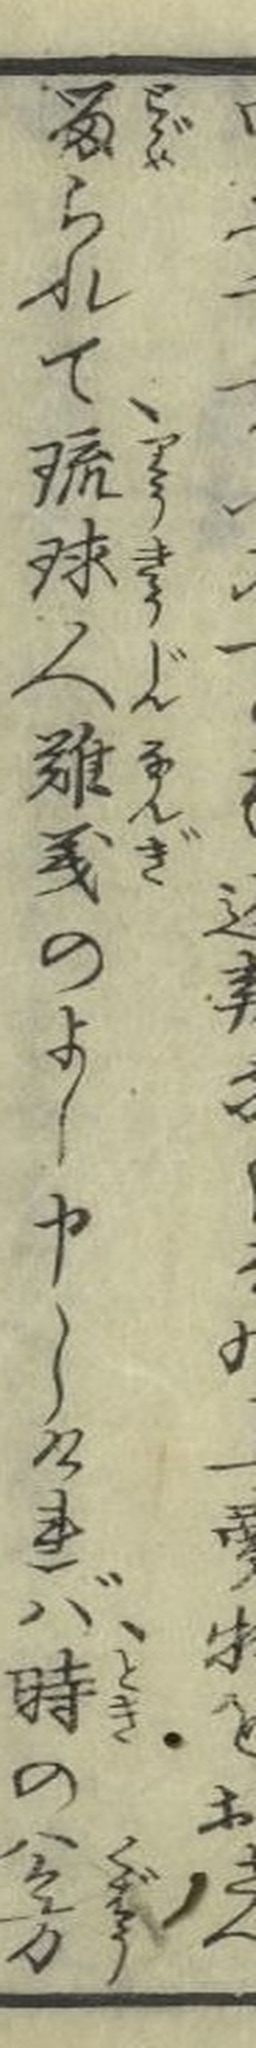留られて、琉球人難義のよし申しければ、時の公方
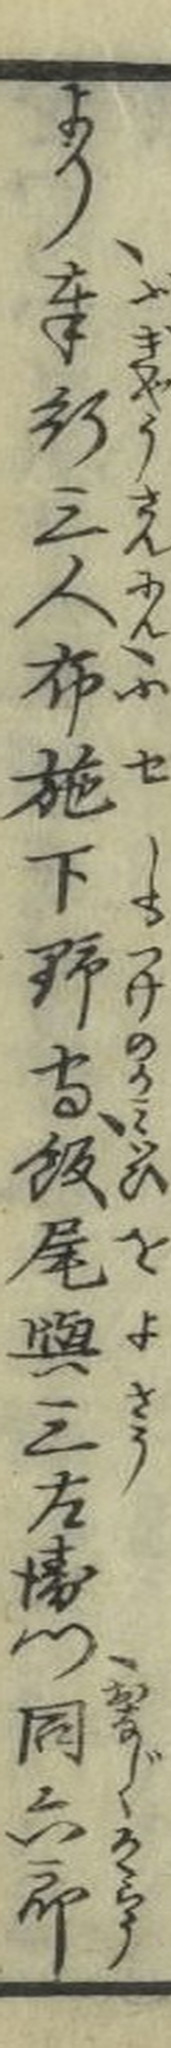より、奉行三人、布施下野守、飯尾与三左衛門、同六郎

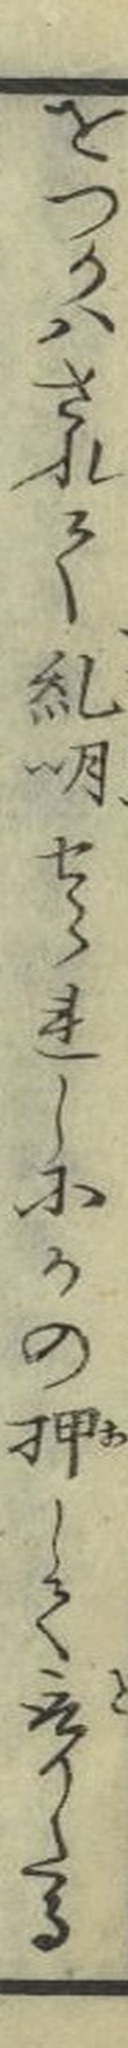をつかはされて、糺明せられしにかの押して取りたる
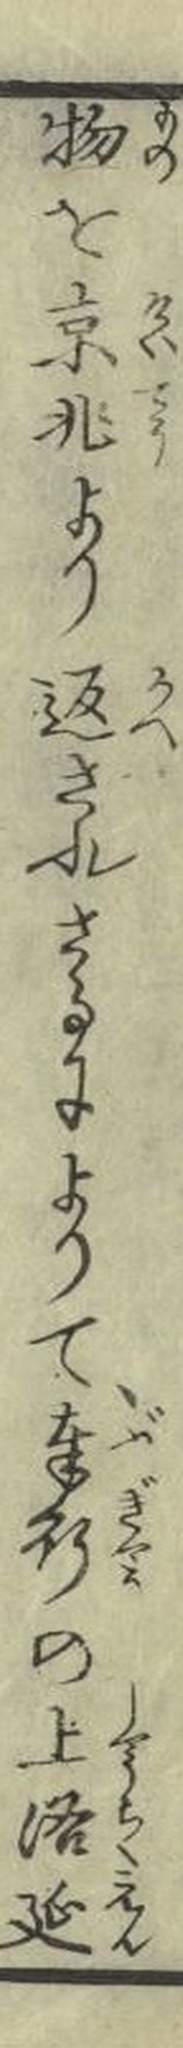物を京兆より返されさるによりて、奉行の上洛延
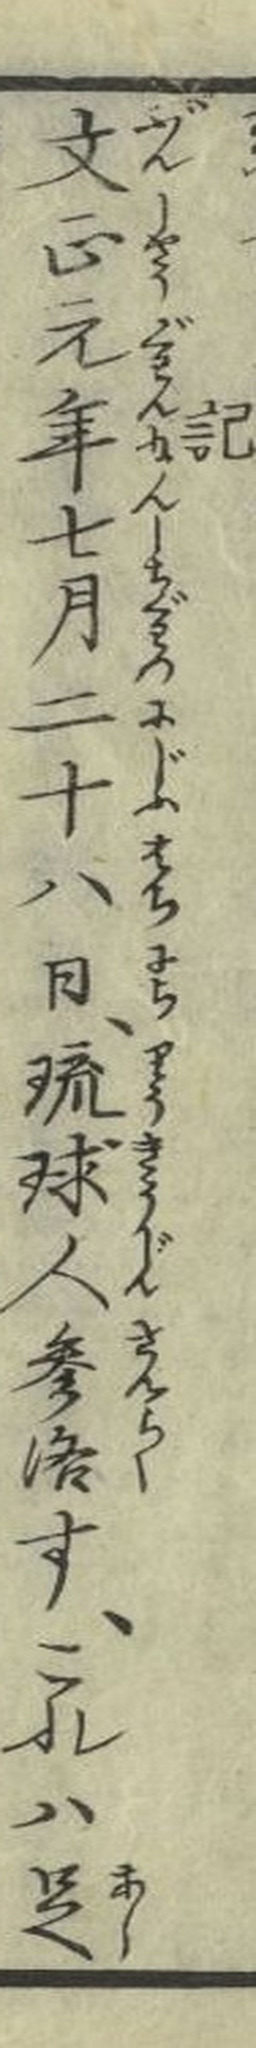文正元年七月二十八日、琉球人参洛す、これは足
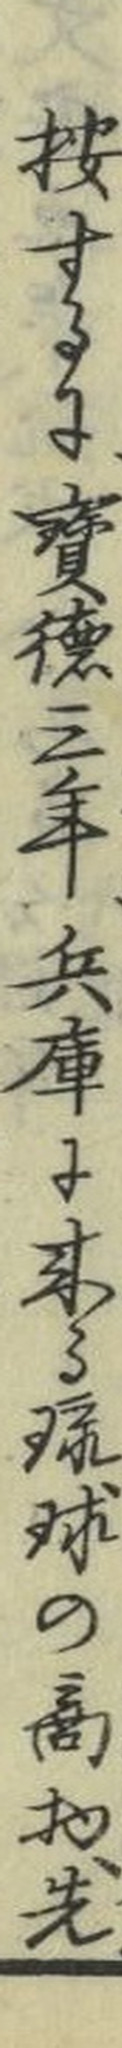按ずるに、宝徳三年、兵庫に来る琉球の商物、先
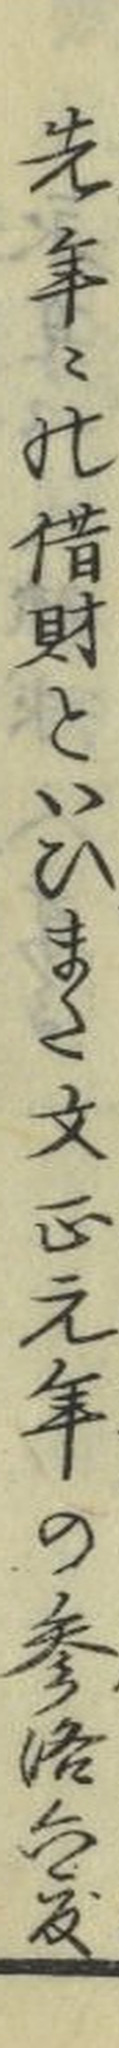先年々の借財といひ、また文正元年の参洛六度
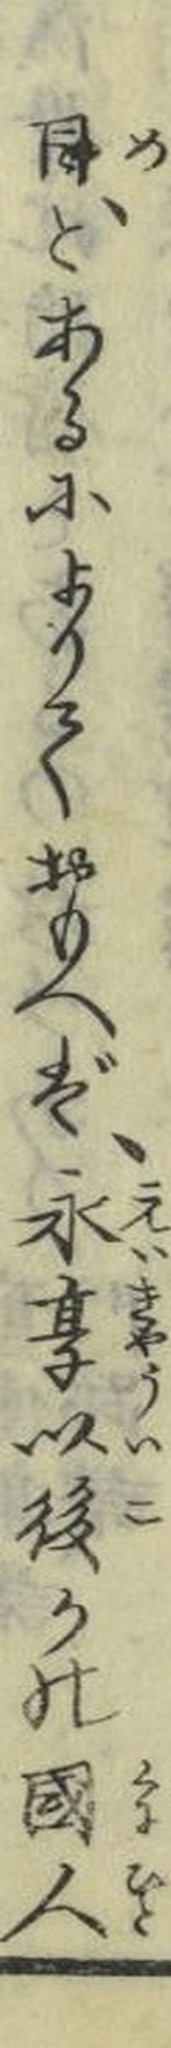目、とあるによりておもへば、永享以後かの国人
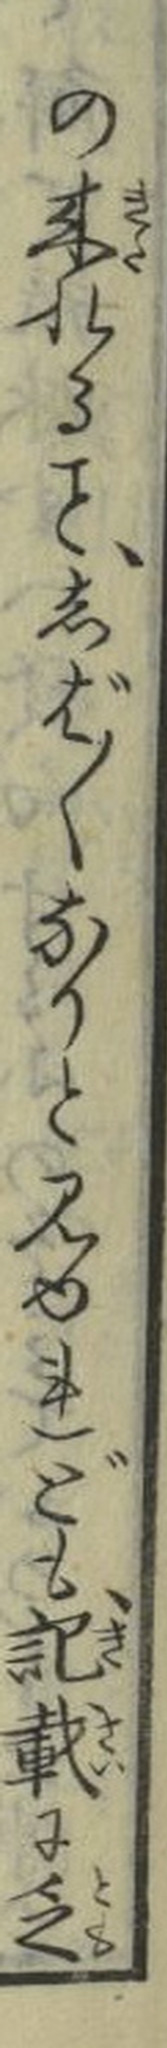の来れること、しば〳〵なりと見ゆれども、記載に乏
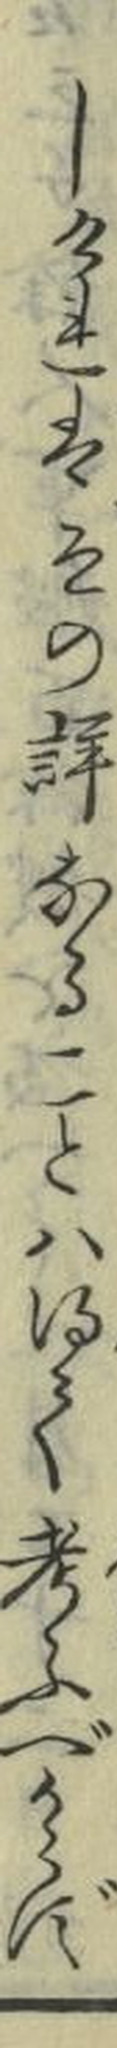しければ、その詳なることは得て考ふべからず
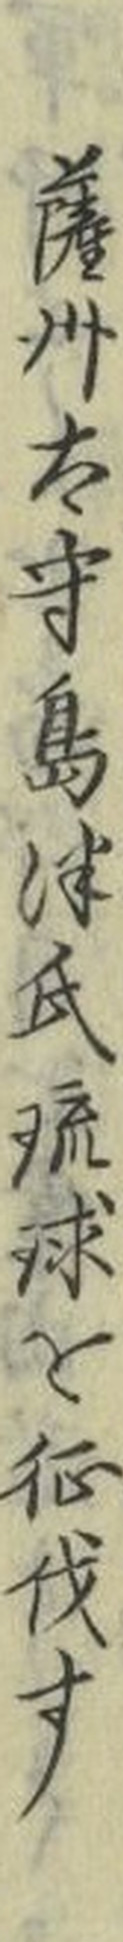薩州太守島津氏琉球を征伐す
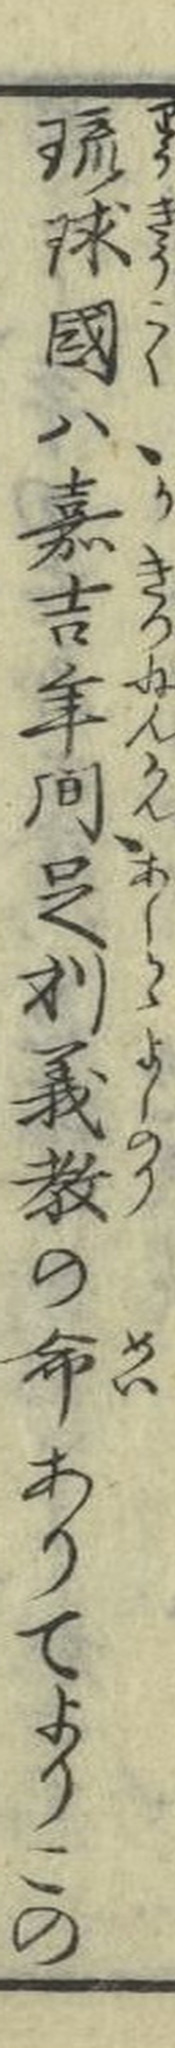琉球国は、嘉吉年間、足利義教の命ありてよりこの
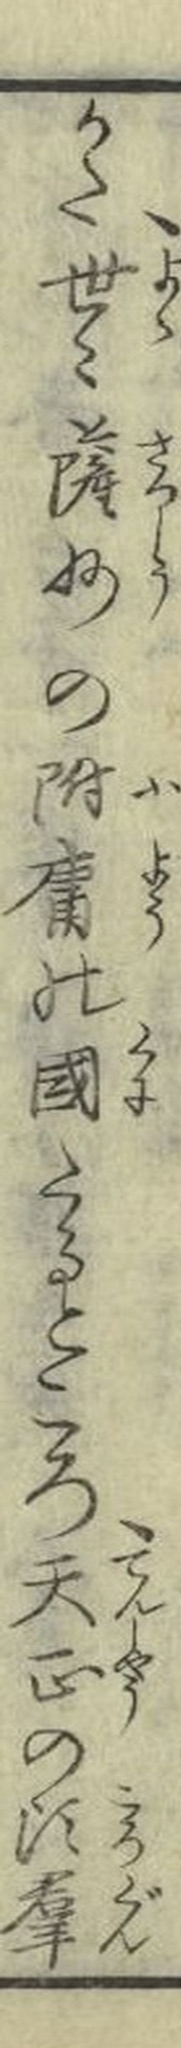かた、世々薩州の附庸の国たるところ、天正の頃群
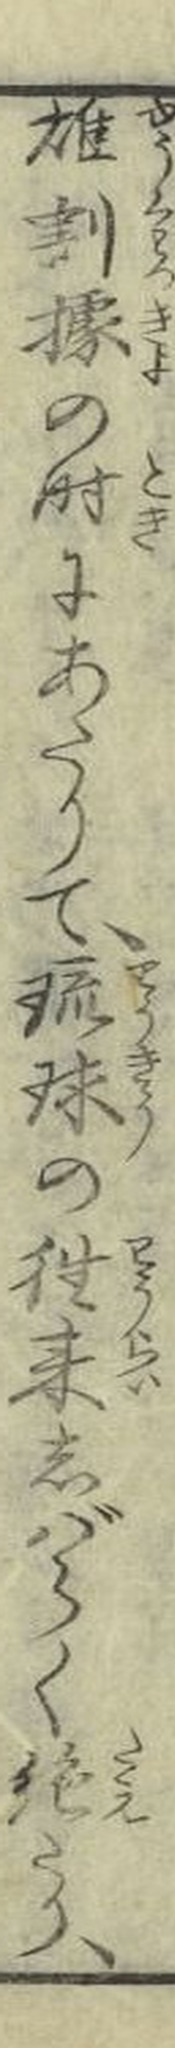雄割拠の時にあたりて、琉球の往来しばらく絶たり、
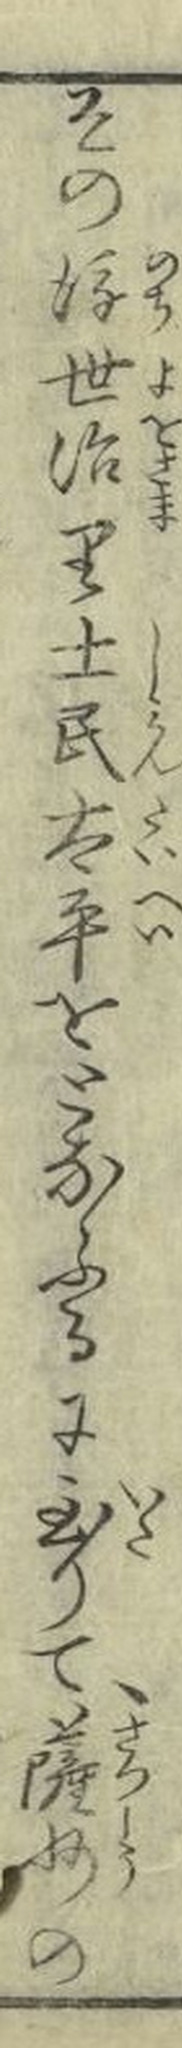その後世治り士民太平をとなふるに至りて、薩州の
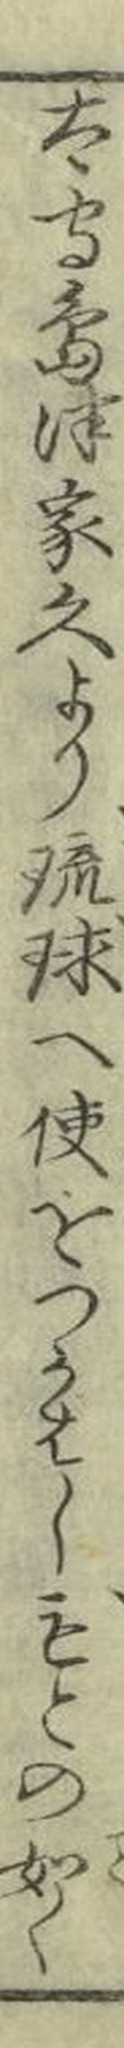太守島津家久より琉球へ使をつかはし、もとの如く
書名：琉球入貢紀略
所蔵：University of the Ryukyus Library
